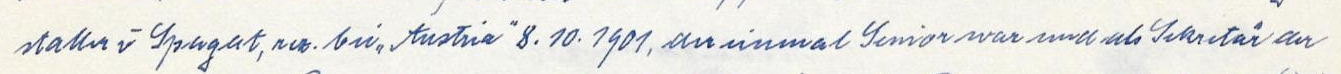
staller v/o Spagat, rez. bei Austria 8.10.1901, der einmal Senior war und als Sekretär der
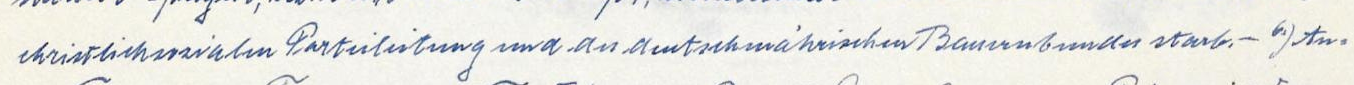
christlichsozialen Parteileitung und des deutschmährischen Bauernbundes starb.- 6) An.
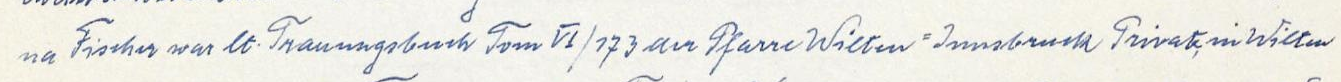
na Fischer war lt Trauungsbuch Tom VI/173 der Pfarre Wilten -Innsbruck Privat in Wilten
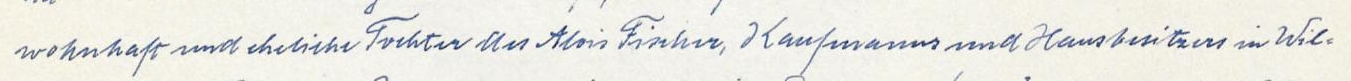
wohnhaft und eheliche Tochter des Alois Fischer, Kaufmanns und Hausbesitzers in Will-
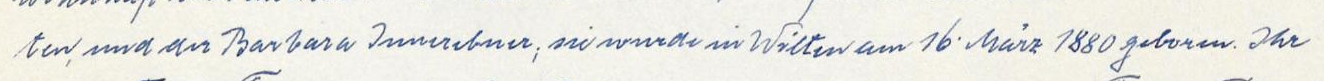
ten, und der Barbara Innerebner, sie wurde in Wilten am 16. März 1880 geboren. Ihr
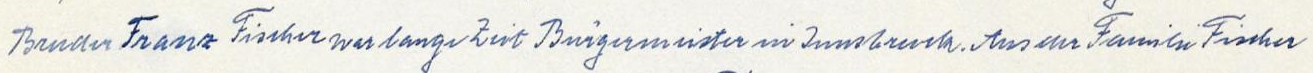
Bruder Franz Fischer war lange Zeit Bürgermeister in Innsbruck. Aus der Familie Fischer
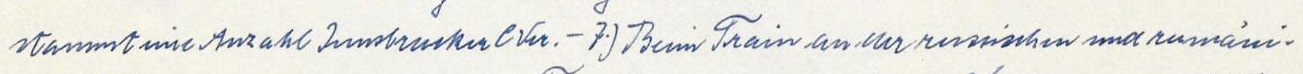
stammt eine Anzahl Innsbrucker CVer.- 7) Beim Train an der russischen und rumäni-
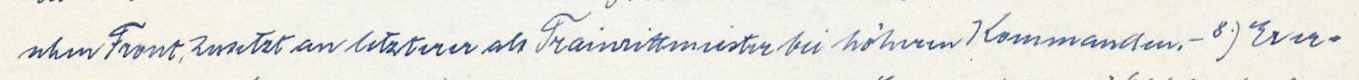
schen Front, zuletzt an Letzterer als Trainrittmeister bei höheren Kommanden.- 8) Er er-
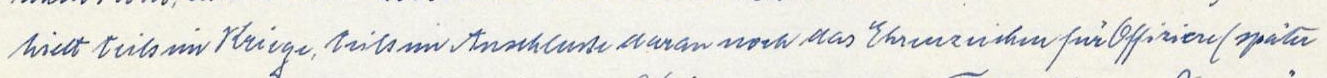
hielt teils im Kriege, teils im Anschluß daran noch das Ehrenzeichen für Offiziere (später
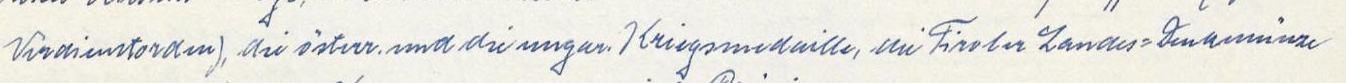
Verdienstorden), die österr. und die ungar. Kriegsmedaille, die Tiroler Landes-Denkmünze
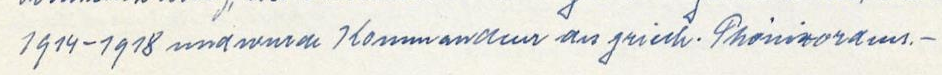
1914 - 1918 und wurde Kommandeur des grieg. Phönixordens.-
